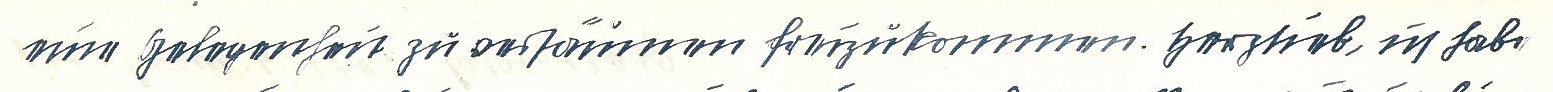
eine Gelegenheit zu versäumen frei zu kommen. Herzlieb, ich habe
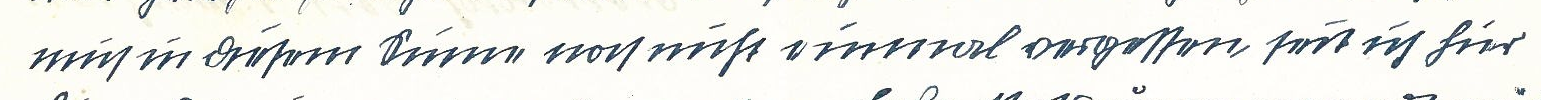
mich in diesem Sinne noch nicht einmal vergessen, seit ich hier
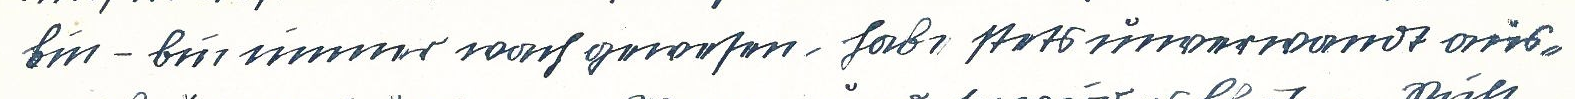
bin – bin immer wach gewesen, habe stets unverwandt aus¬
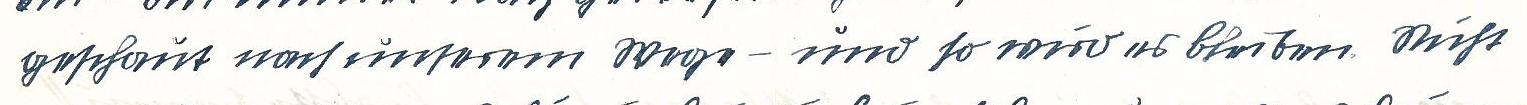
geschaut nach unserem Wege – und so wird es bleiben. Nicht
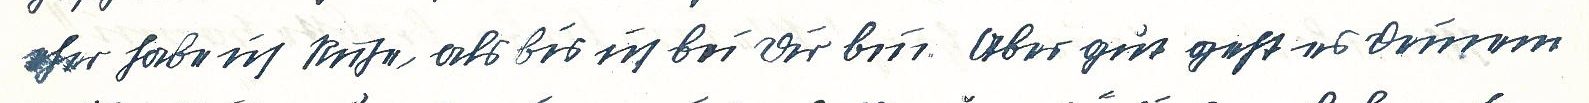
eher habe ich Ruhe, als bis ich bei Dir bin. Aber gut geht es Deinem
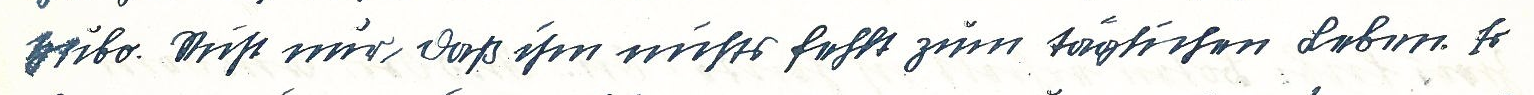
Hubo. Nicht nur, daß ihm nichts fehlt zum täglichen Leben. Er
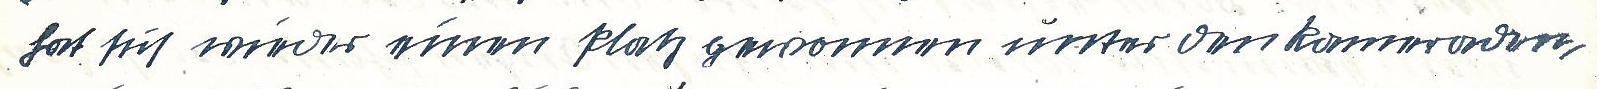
hat sich wieder einen Platz gewonnen unter den Kameraden,
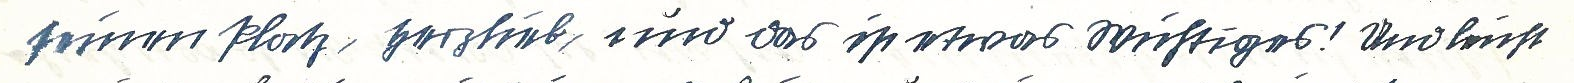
seinen Platz, Herzlieb, und das ist etwas Wichtiges! Und leicht
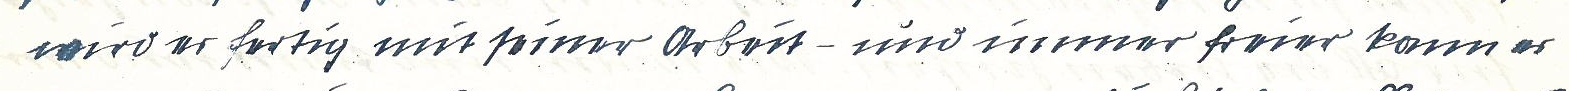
wird er fertig mit seiner Arbeit – und immer freier kann er
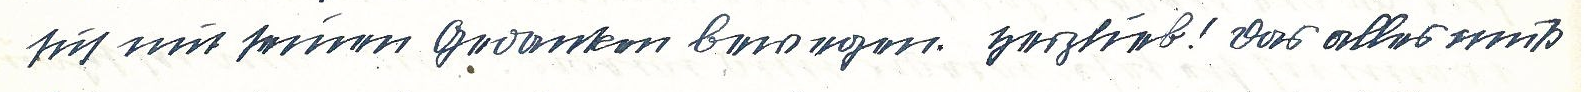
sich mit seinen Gedanken bewegen. Herzlieb! Das alles muß
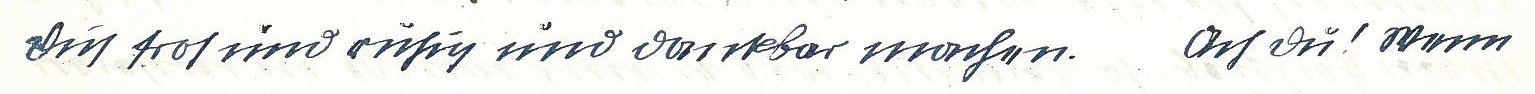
Dich froh und ruhig und dankbar machen. Ach Du! Wenn
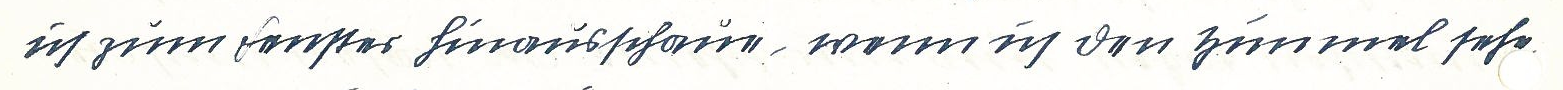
ich zum Fenster hinausschaue, wenn ich den Himmel sehe,
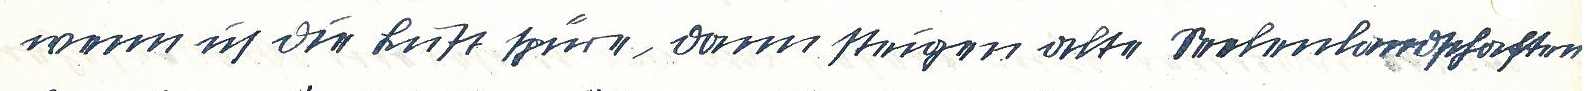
wenn ich die Luft spüre, dann steigen alte Seelenlandschaften
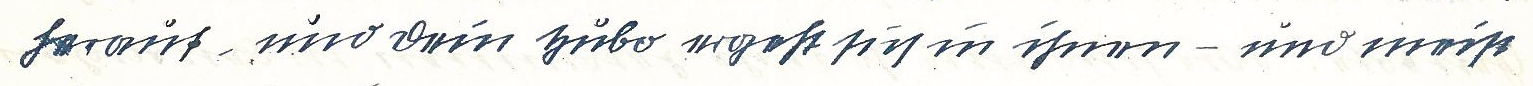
herauf, und Dein Hubo ergeht sich in ihnen – und meist
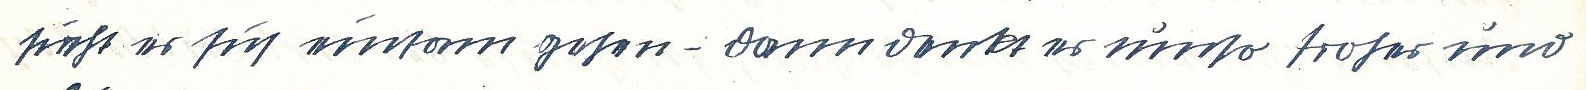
sieht er sich einsam gehen – dann denkt er um so froher und
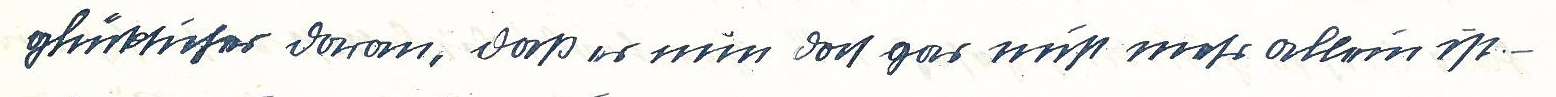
glücklicher daran, daß er doch nun gar nicht mehr allein ist –
